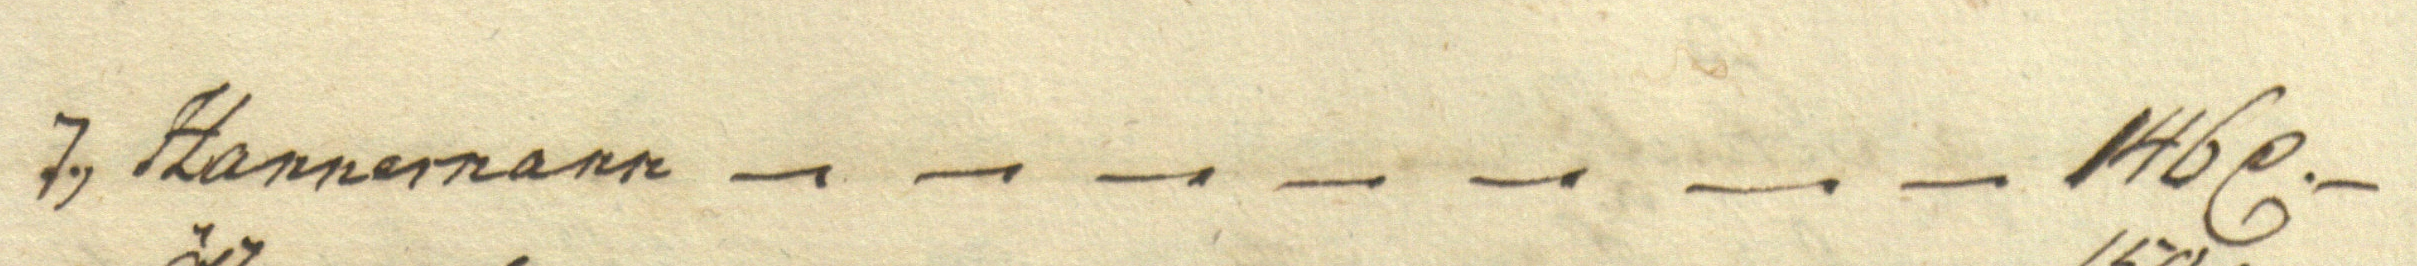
7., Hannemann 146 l
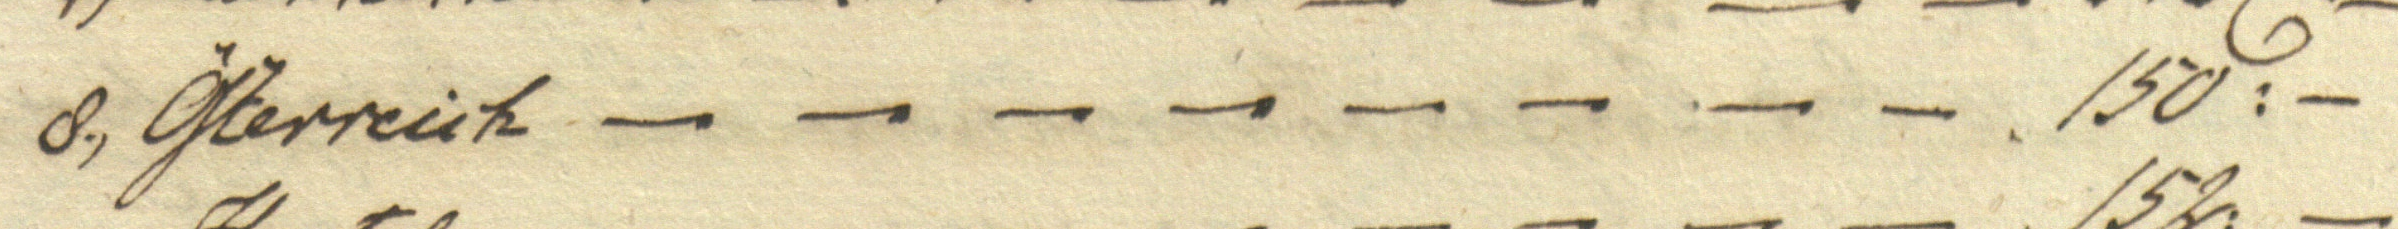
8., Österreich 150:
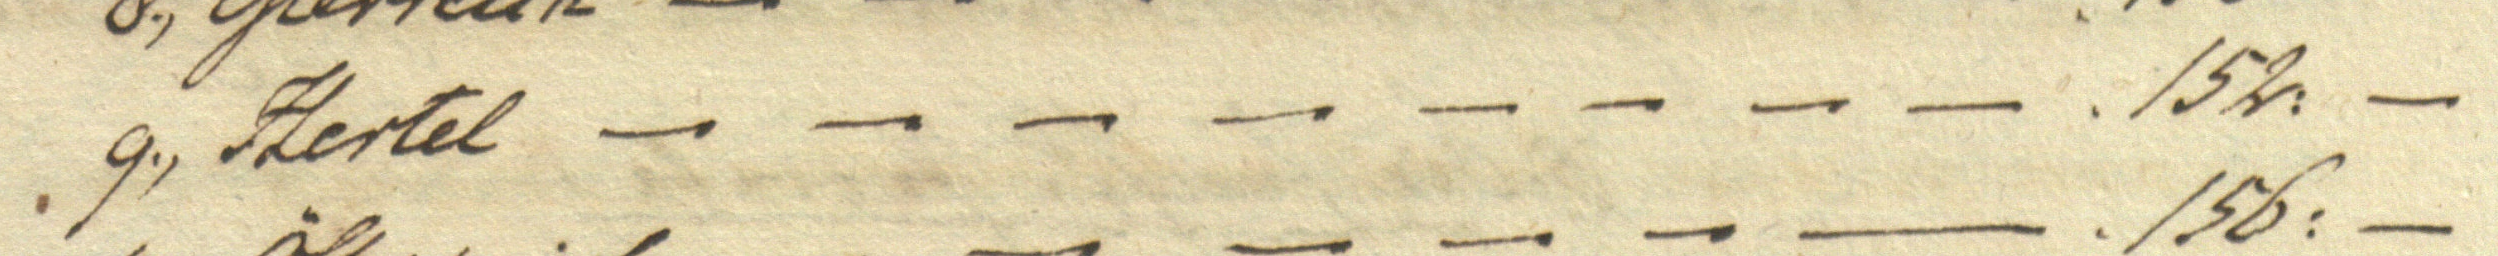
9., Hertel 152:
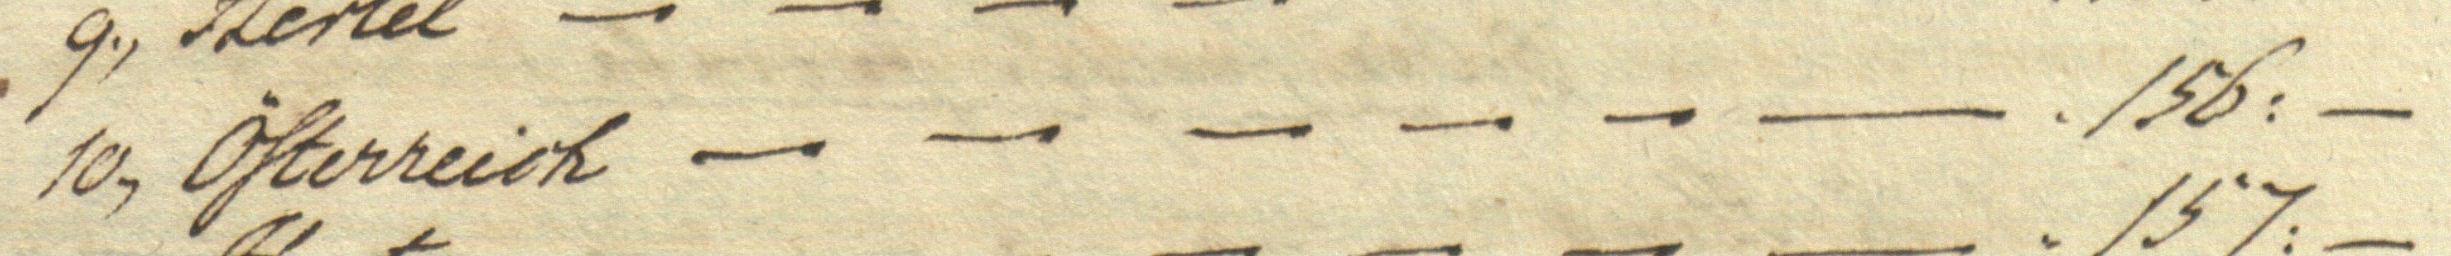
10., Österreich 156:
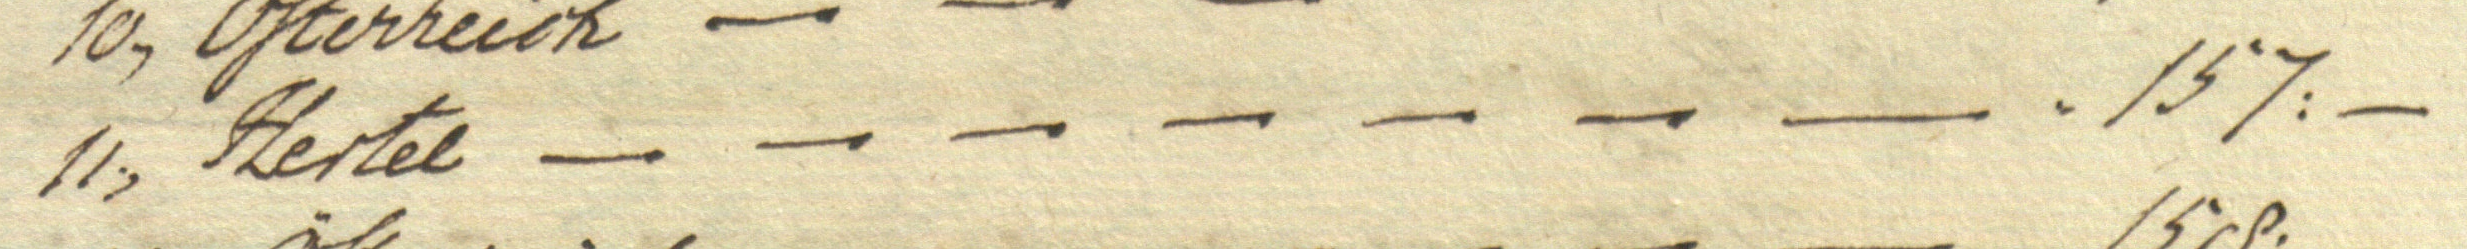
11., Hertel 157:
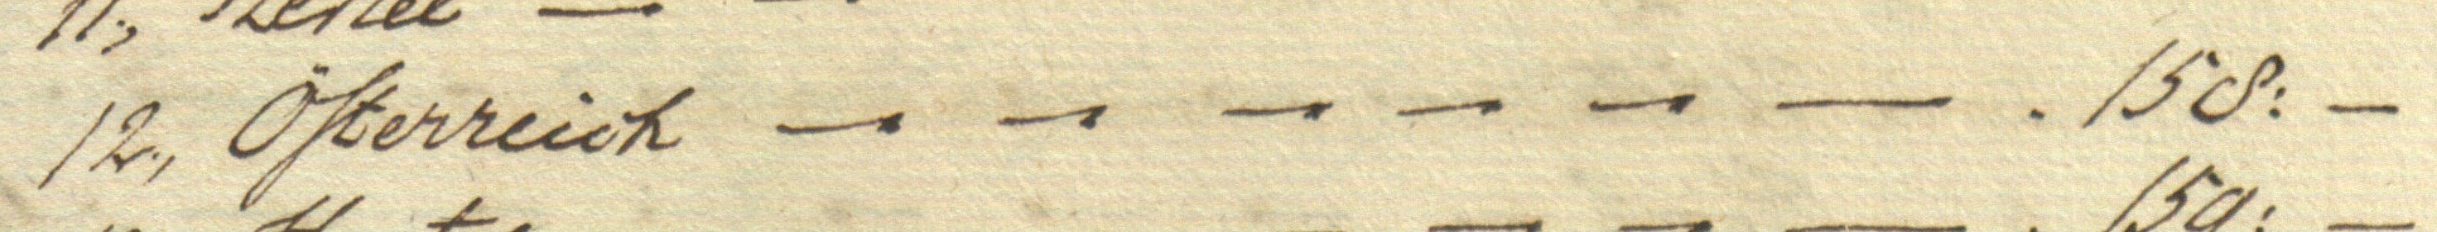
12., Österreich 158:
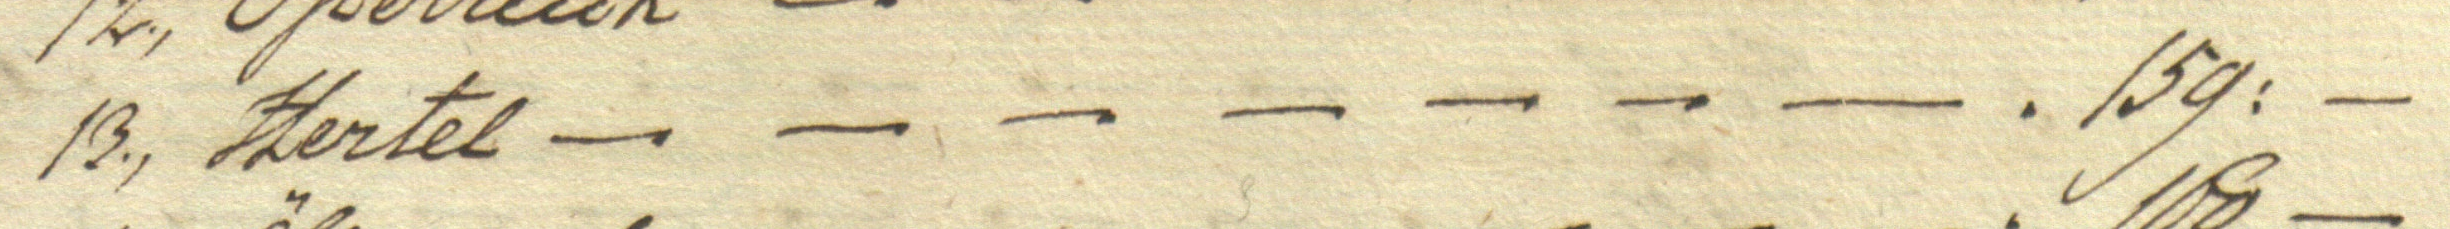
13., Hertel 159:
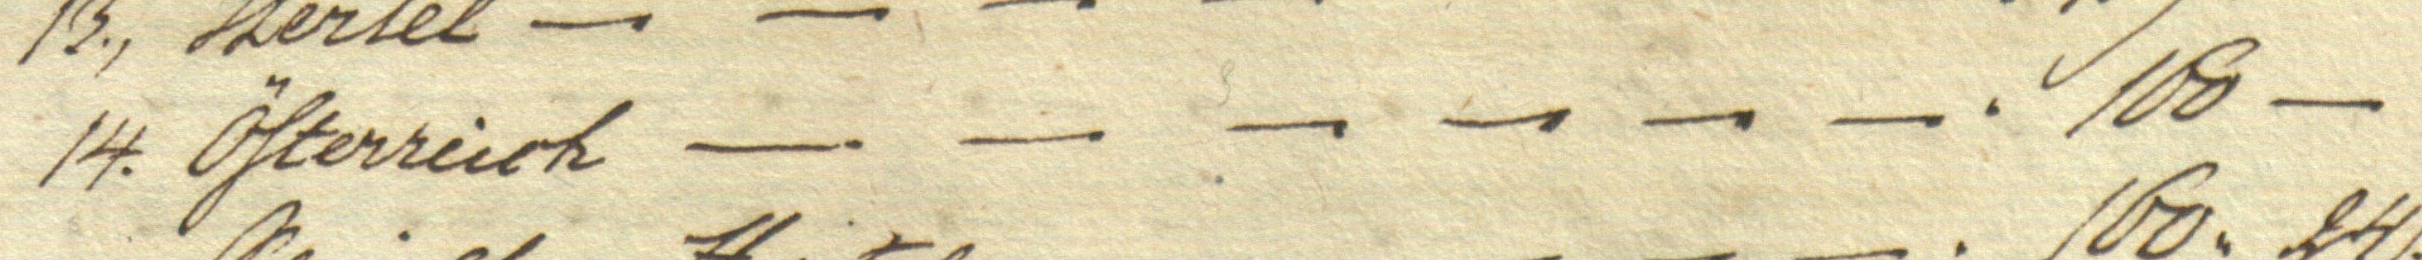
14., Österreich 160:
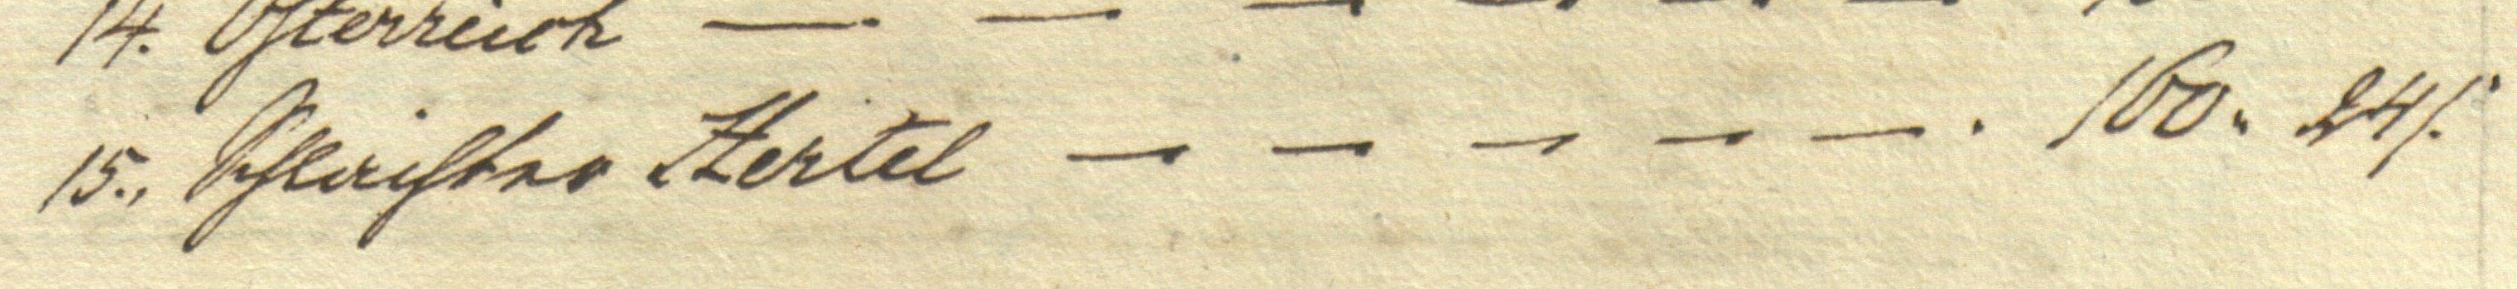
15. Schlächter Hertel 160: 24s.
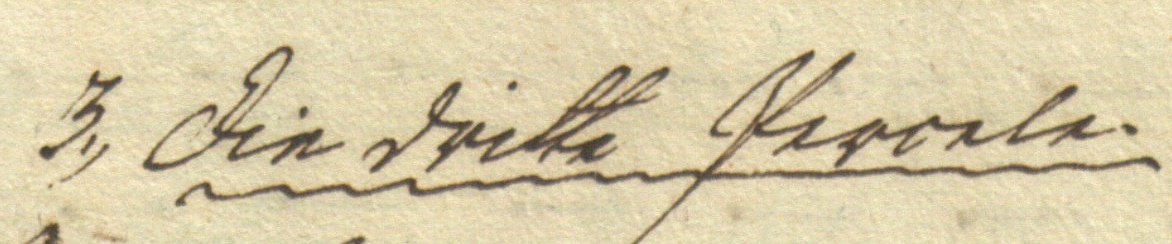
3. Die dritte Percele
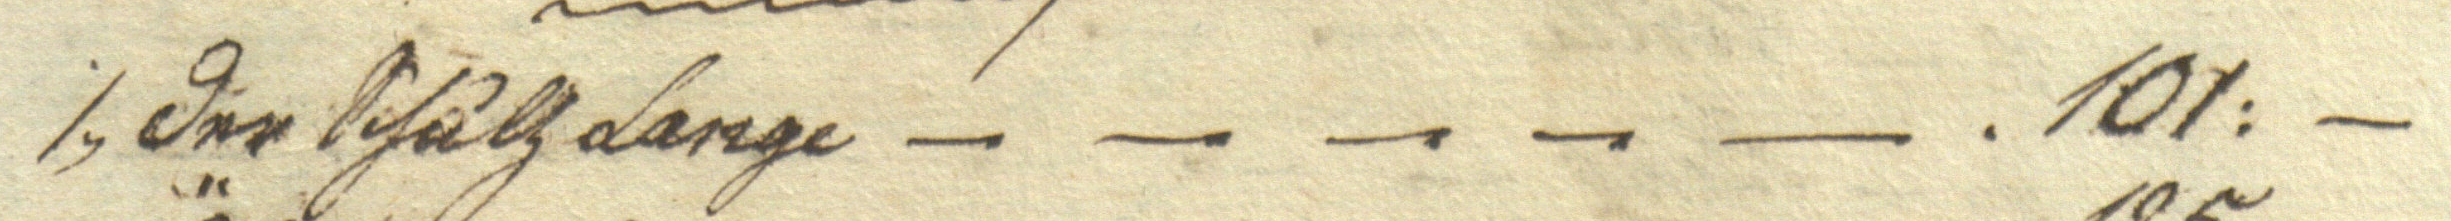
1., Der Schulz Lange 101:
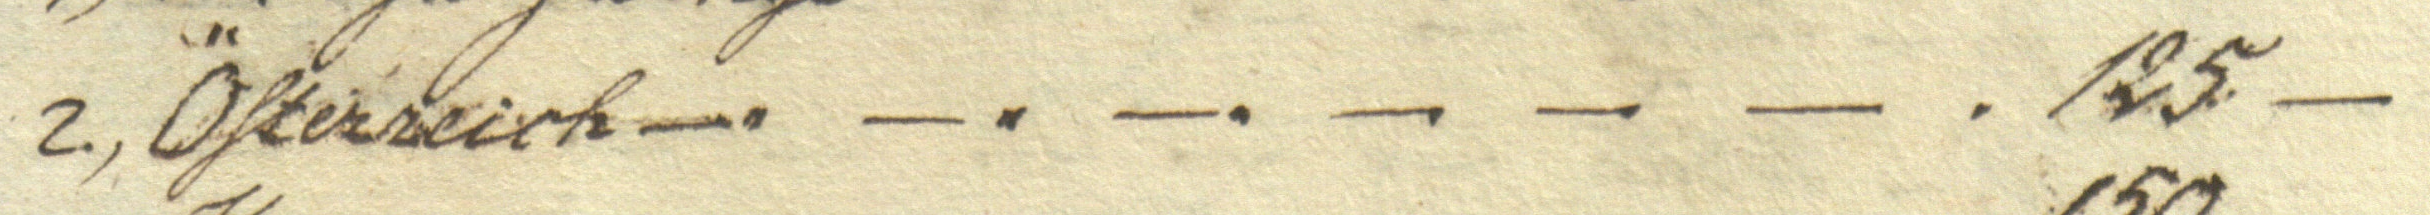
2., Österreich 125:
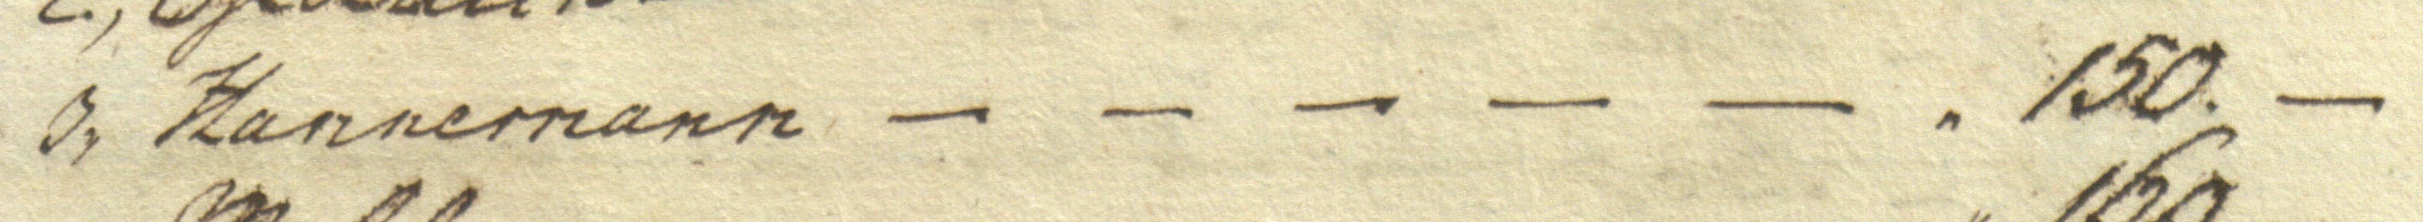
3., Hannemann 150:
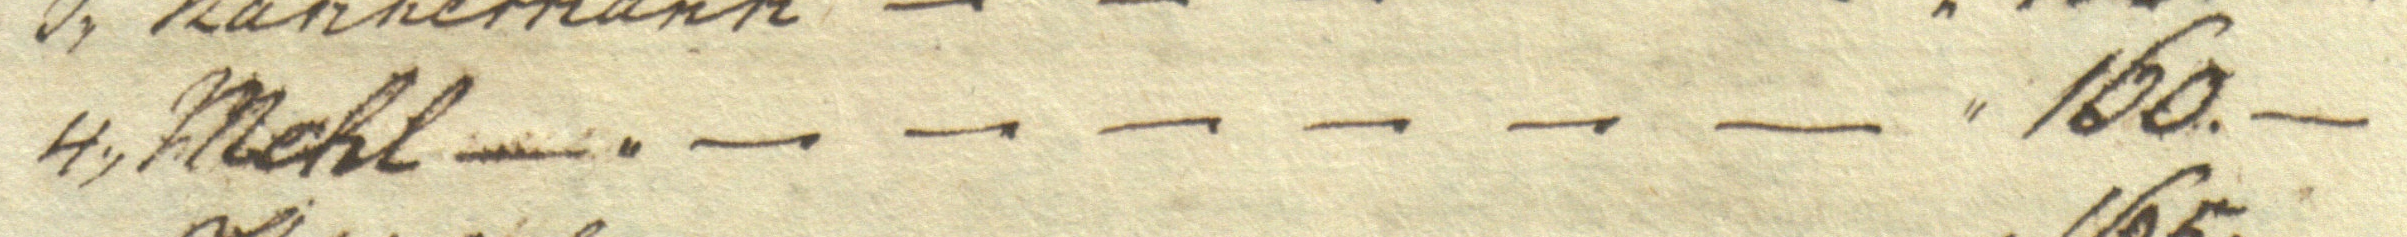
4., Mehl 160:
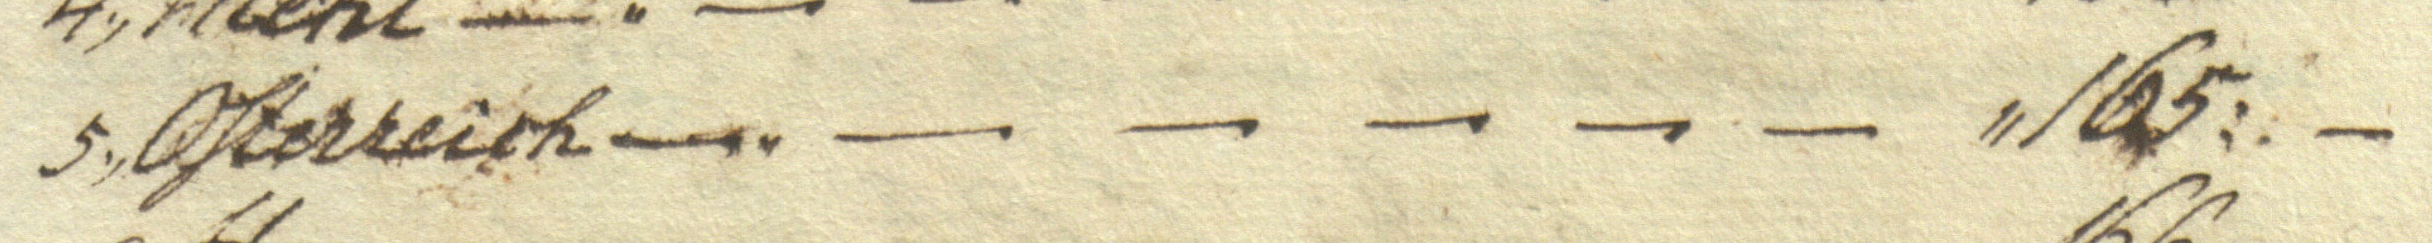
5., Osterreich 165:
